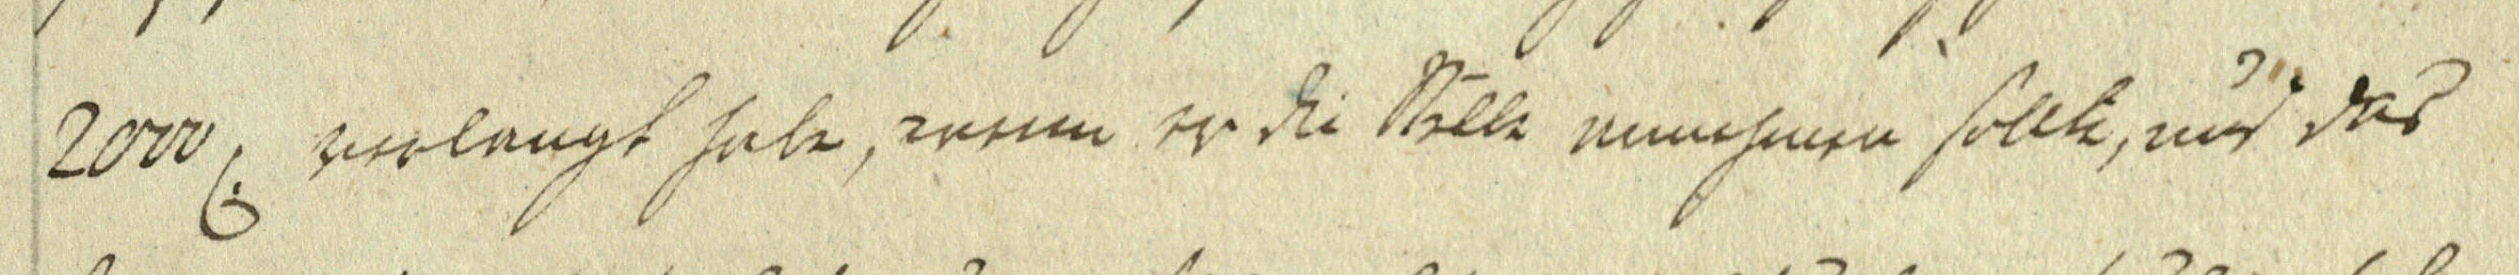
2000 l. verlangt habe, wenn er die Stelle annehmen sollte, und das
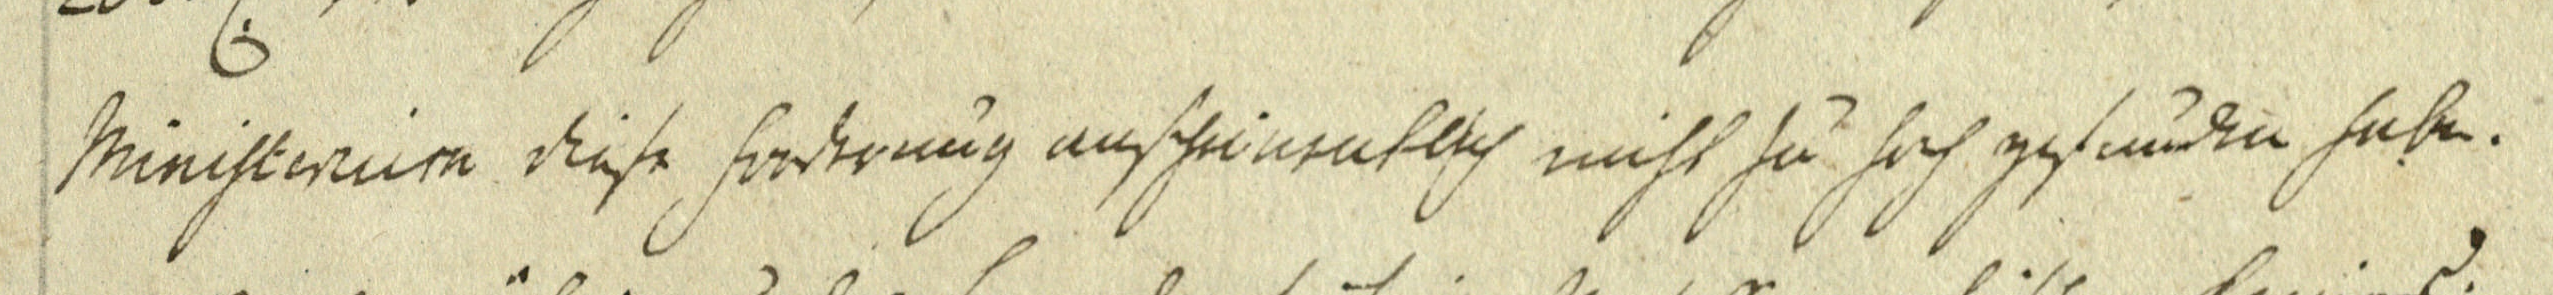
Ministerium diese Forderung anscheinentlich nicht zu hoch gefunden habe.
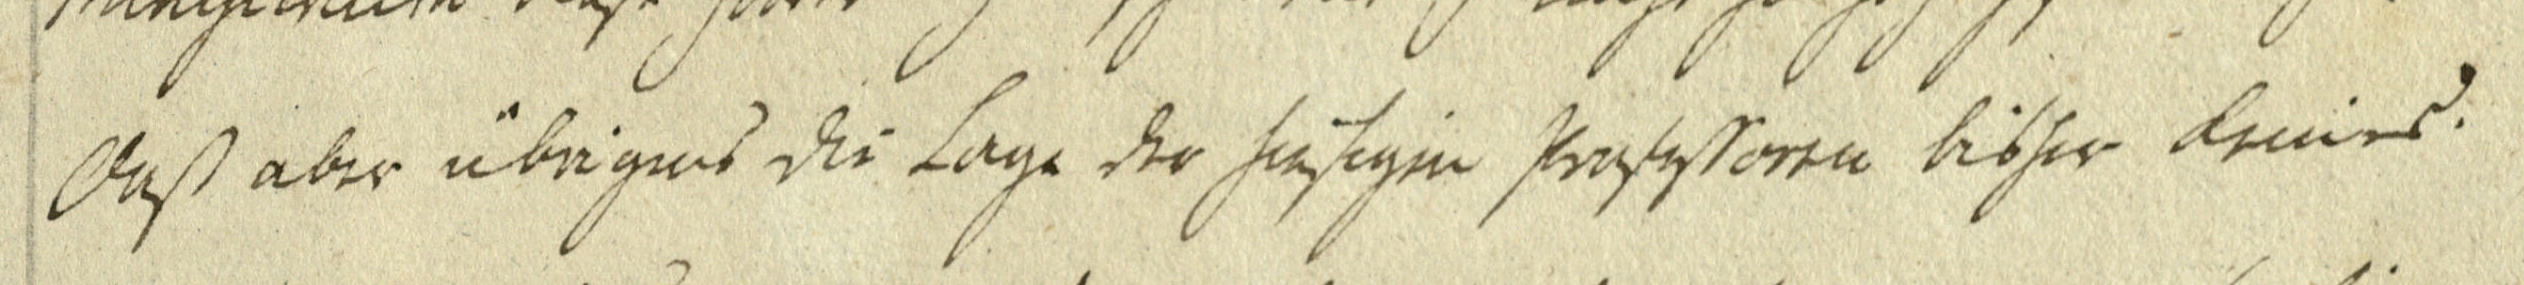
Daß aber übrigens die Lage der hiesigen Professoren bisher keines¬
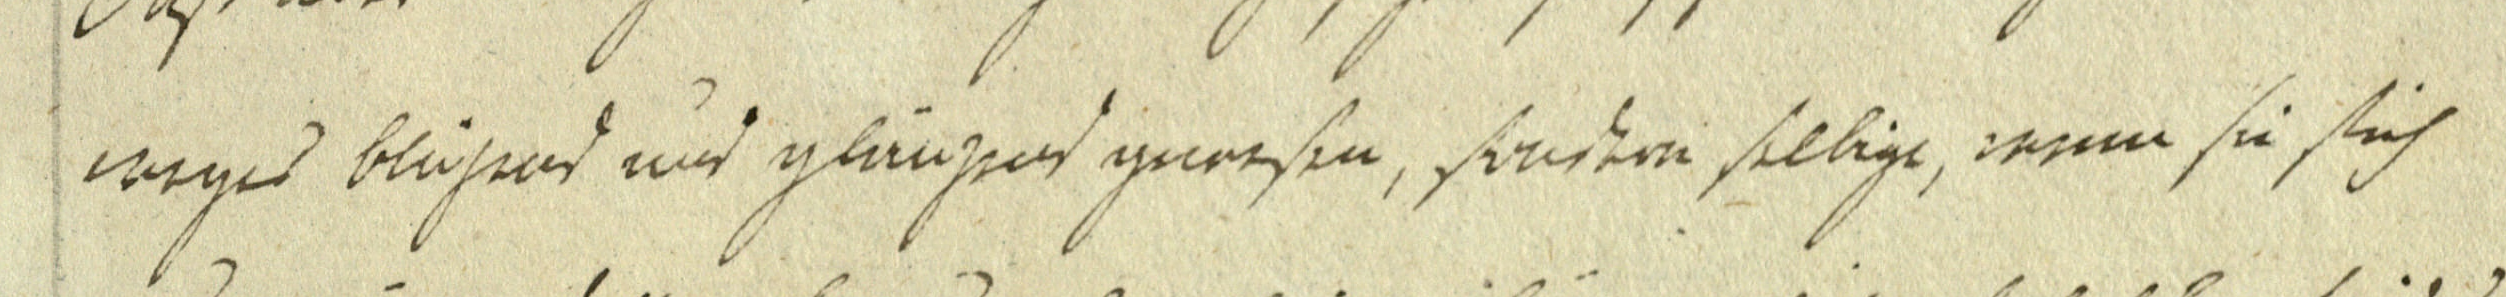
weges blühend und glänzend gewesen, sondern selbige, wenn sie sich
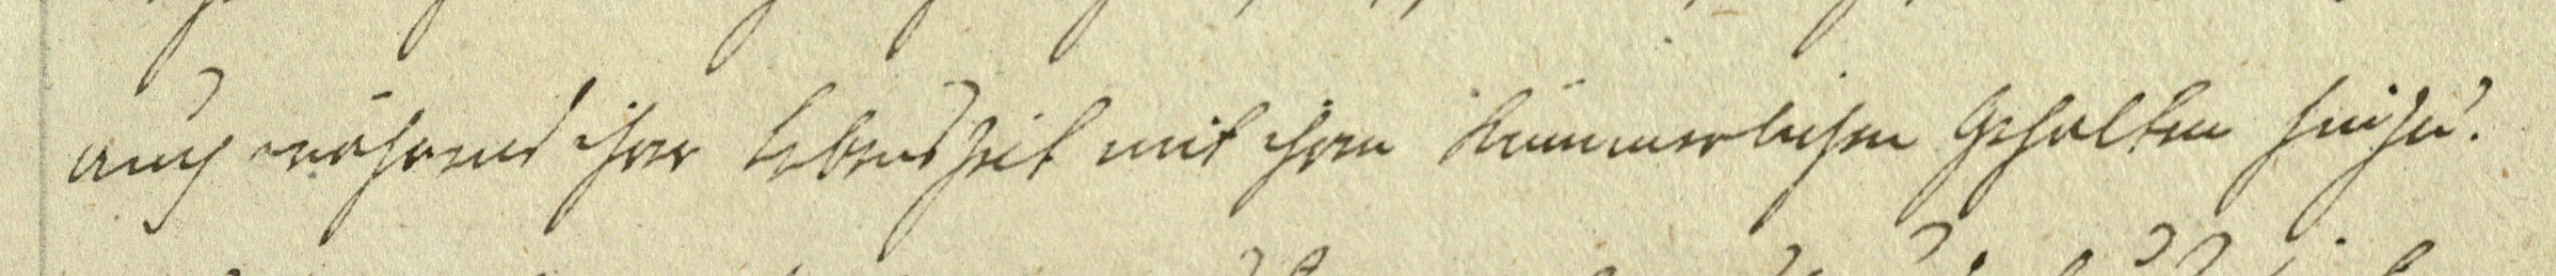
auch während ihrer Lebenszeit mit ihren kümmerlichen Gehalten hinzu¬
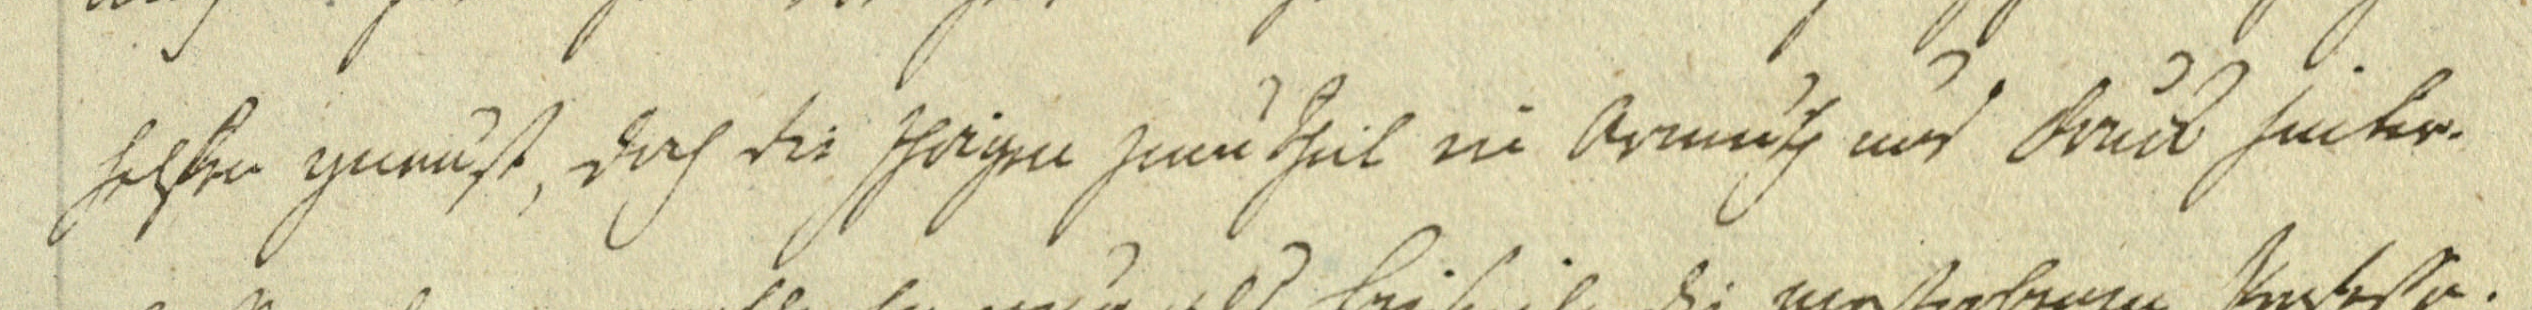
helfen gewußt, sich die Ihrigen zum theil in Armuth und Druck hinter¬
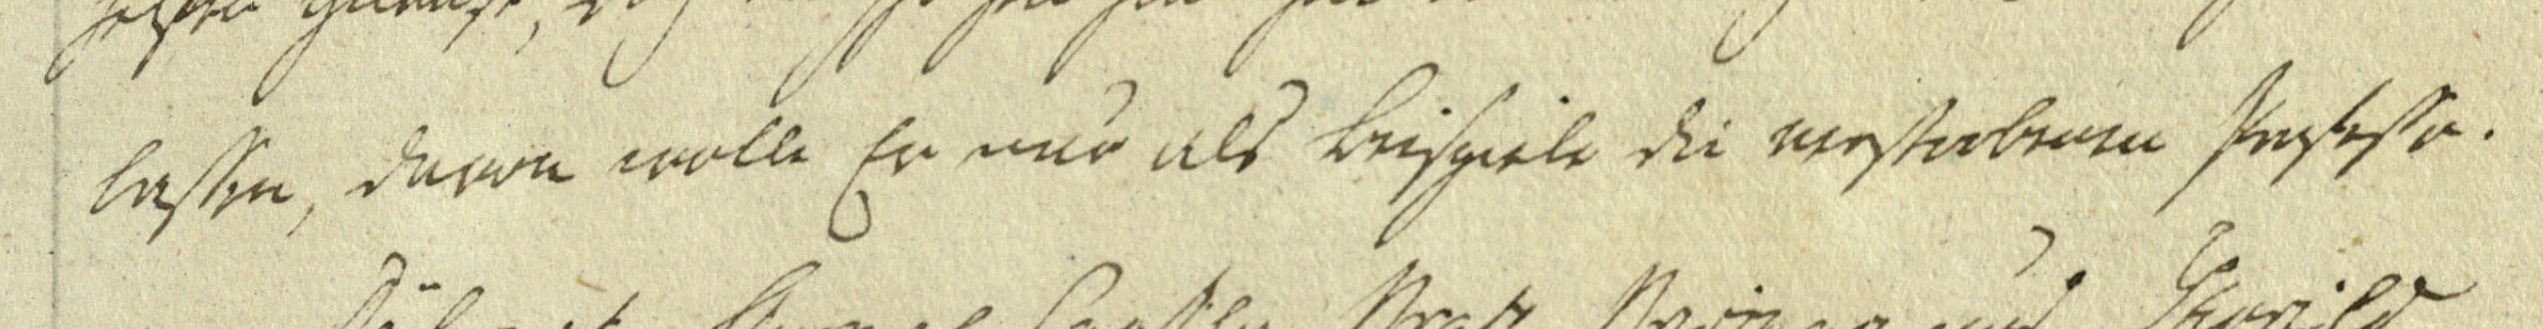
lassen, davon wolle Er nur als Beispiele die verstorbenen Professo¬
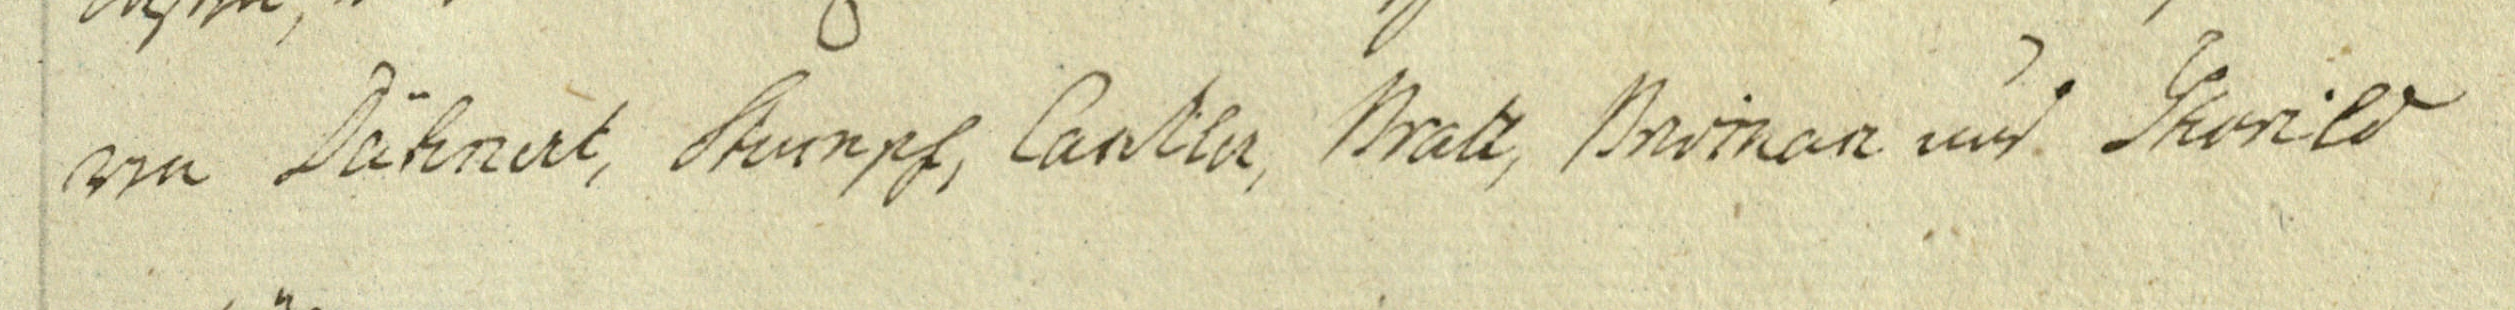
ren Dähnert, Stumpf, Canzler, Bratt, Brisman und Thorild
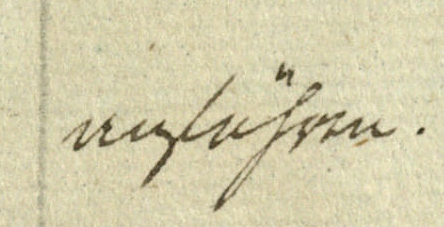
anführen.
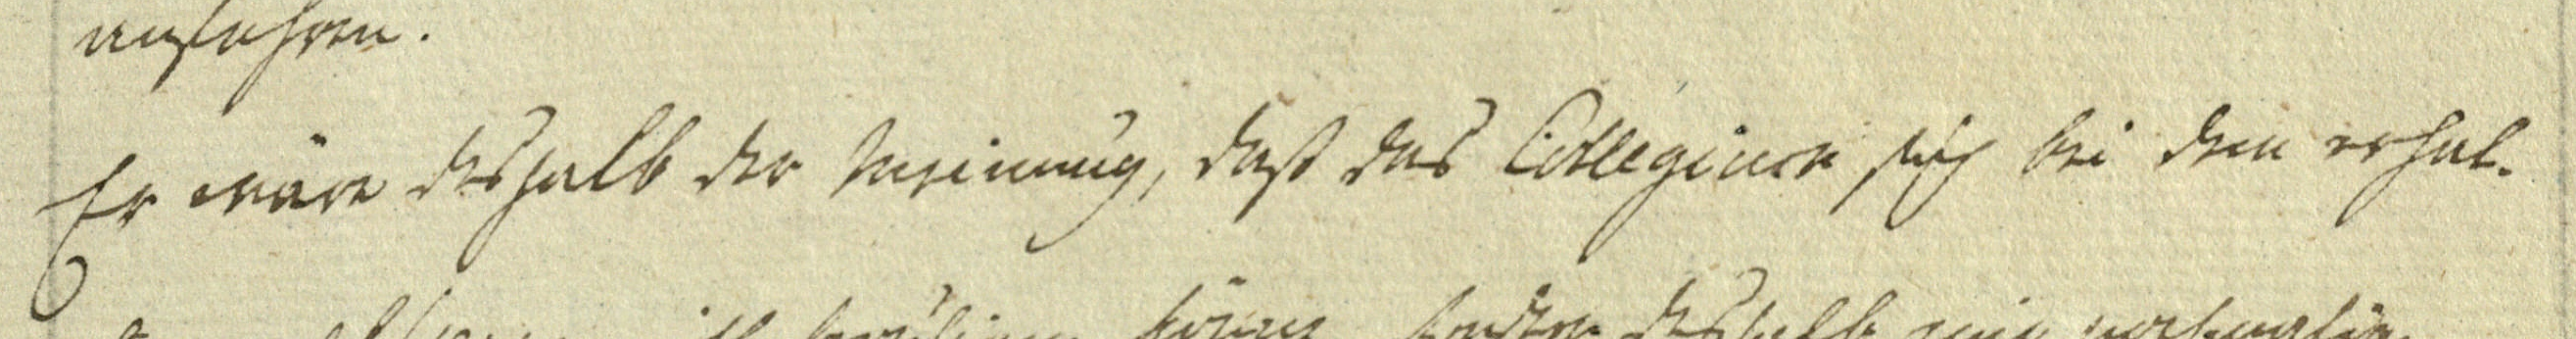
Er wäre deshalb der Meinung, daß das Collegium sich bei dem erhal¬
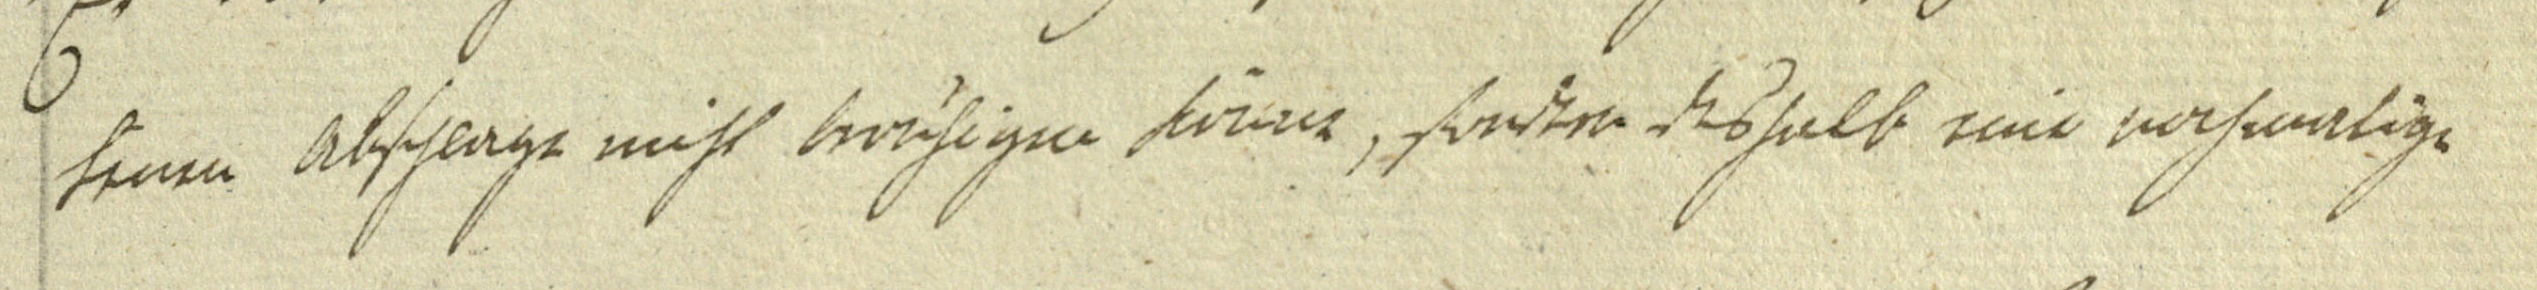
tenen Abschlage nicht beruhigen könne, sondern deshalb eine nochmalige
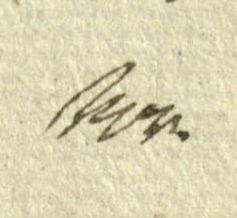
vor¬
